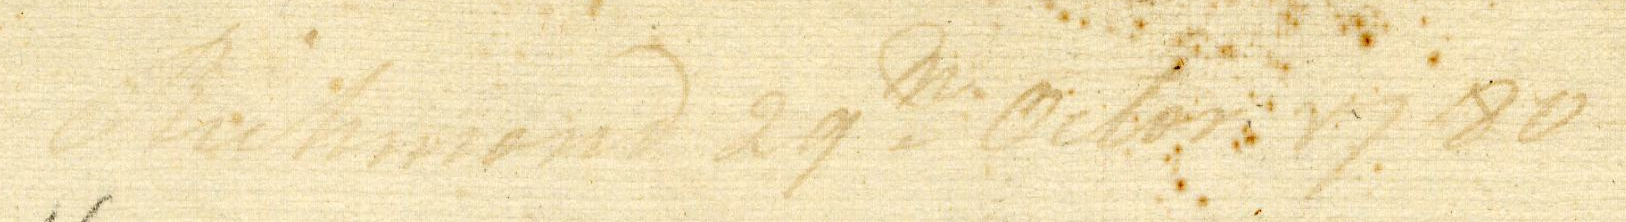Richmond 29^th. Octor 1780
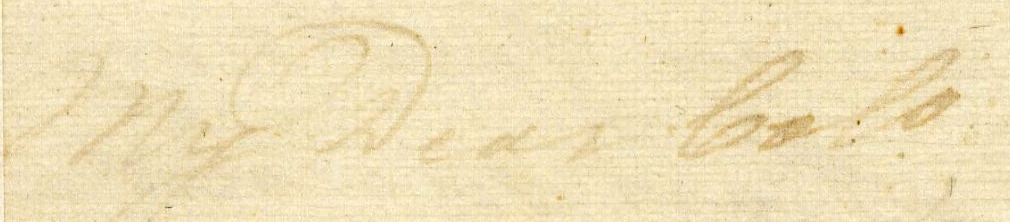My Dear Col^o
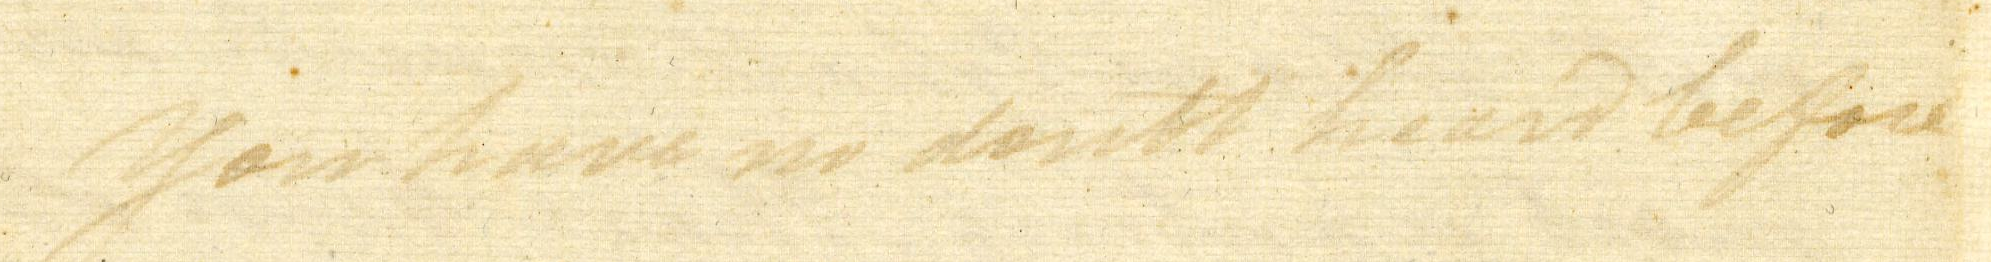You have no doubt heard before
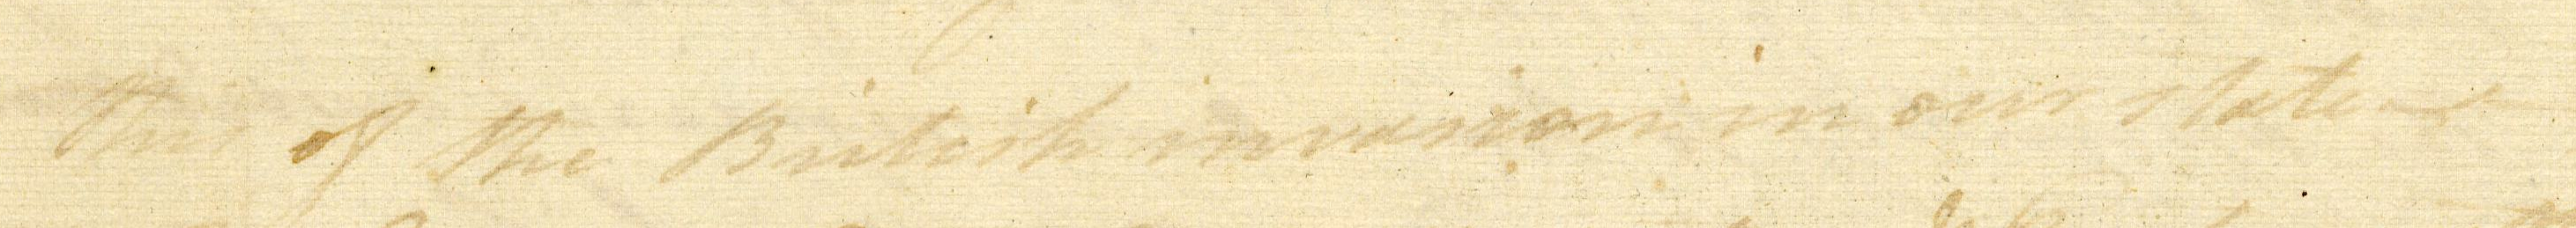this of the British invasion in our state-
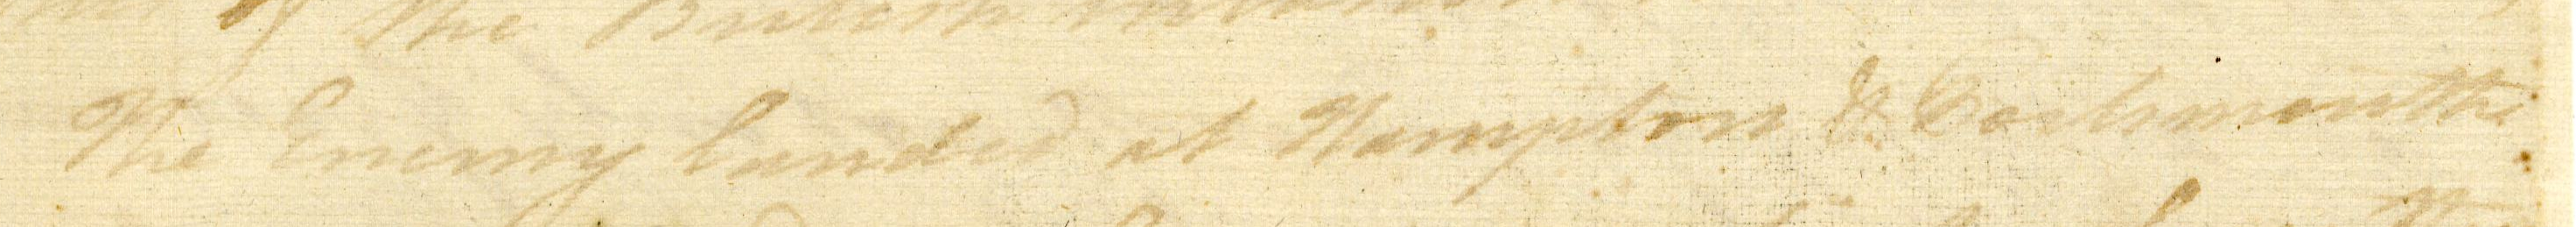The Enemy landed at Hampton & Portsmouth
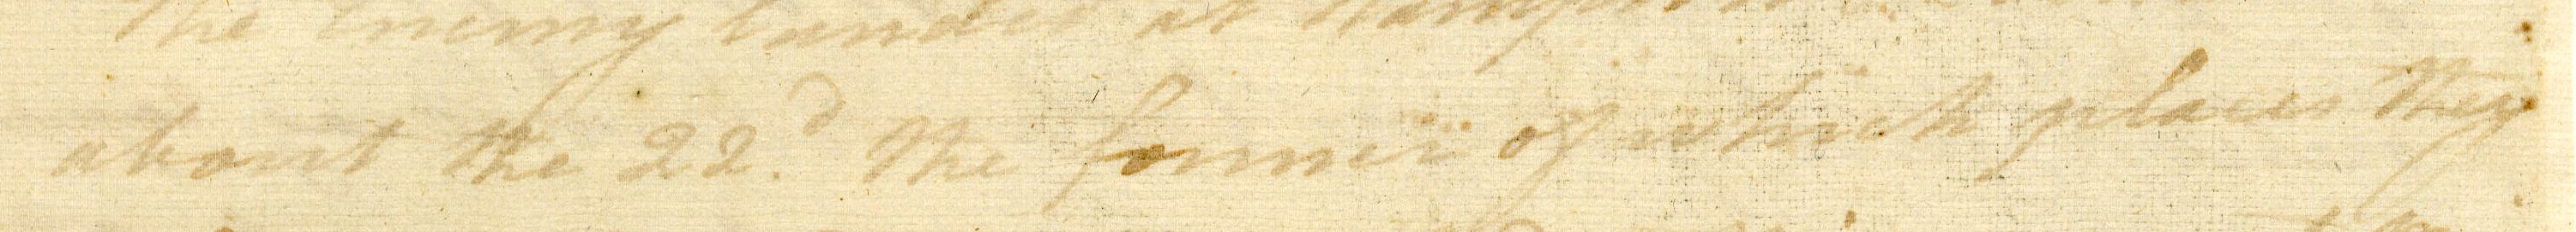about the 22^d. the former of which places they
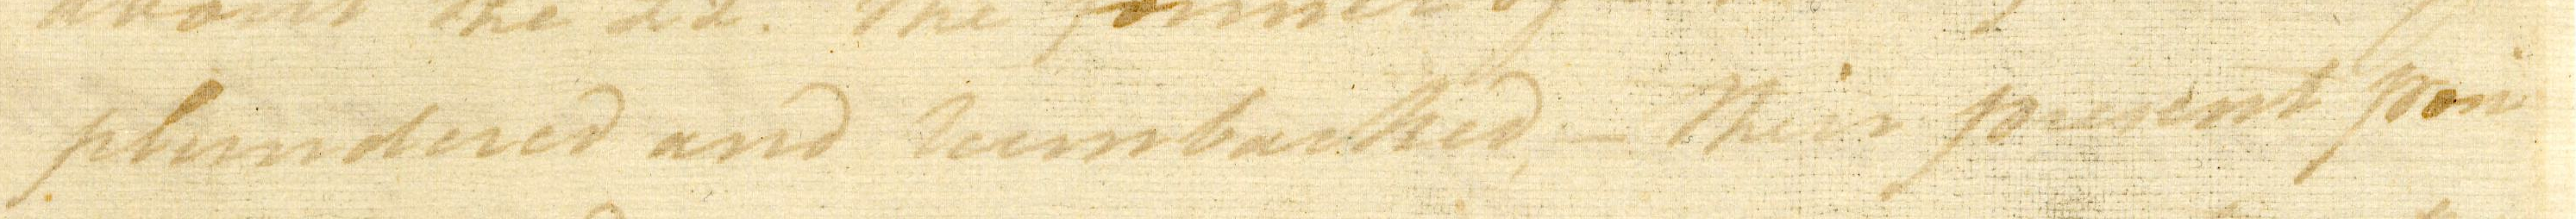plundered and reimbarked- their present posi
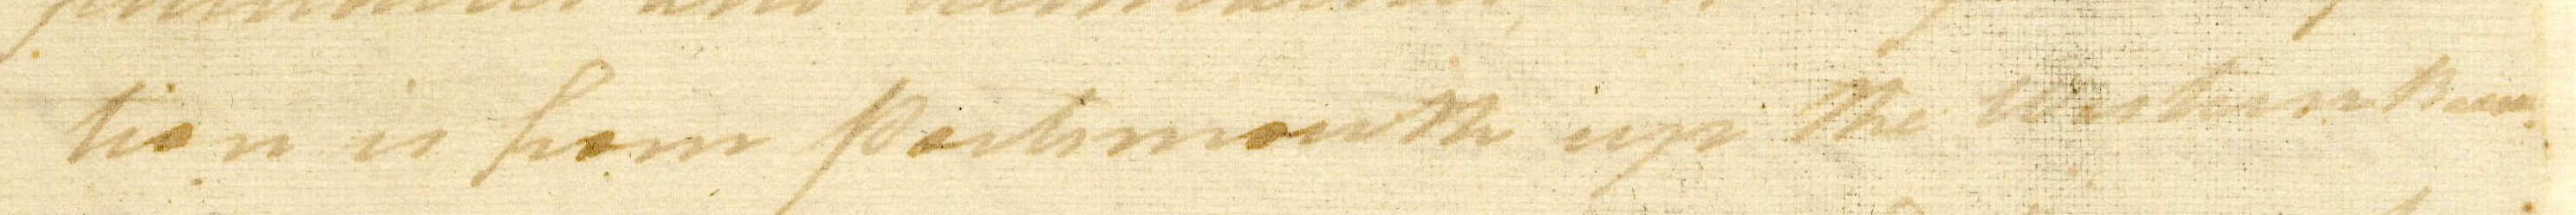tion is from portsmouth up the Western Bank
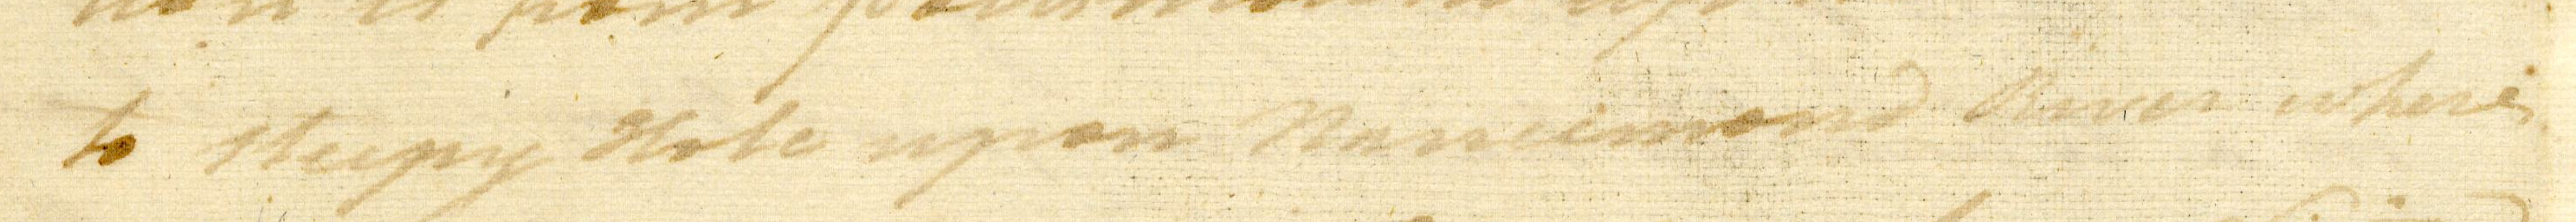to sleepy Hole upon Nansimond River where
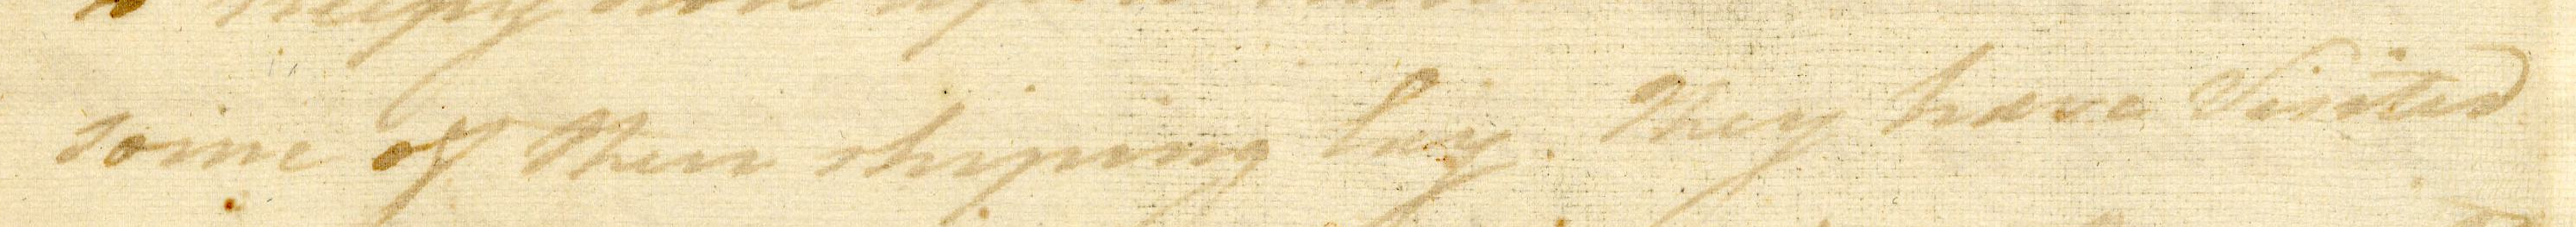some of their shipping lay. They have Visited
